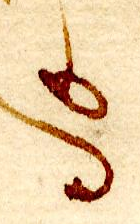To
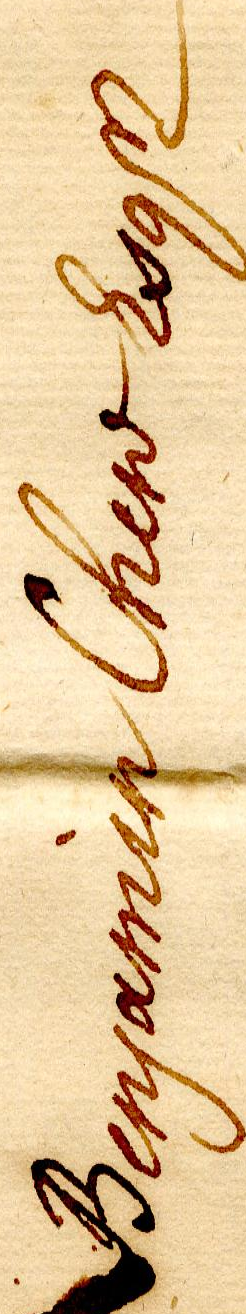Benjamin Chew Esq^r.
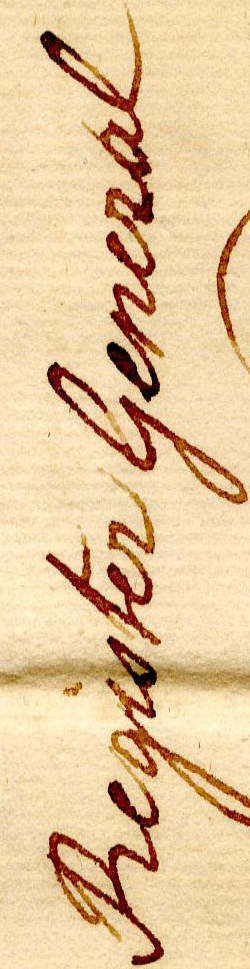Register General
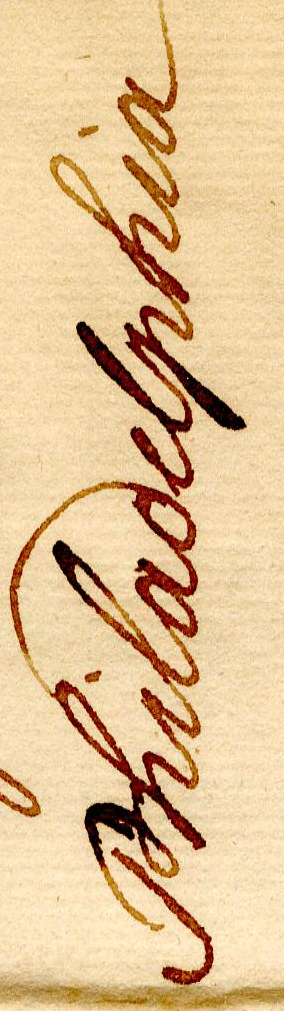Philadelphia
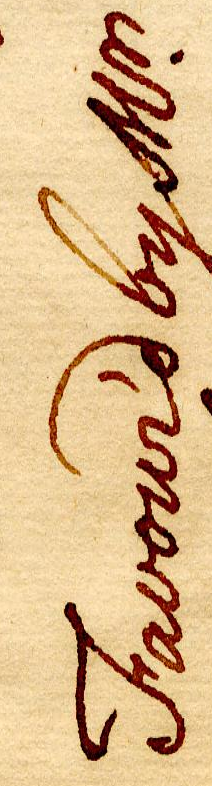Favour'd by M^r.
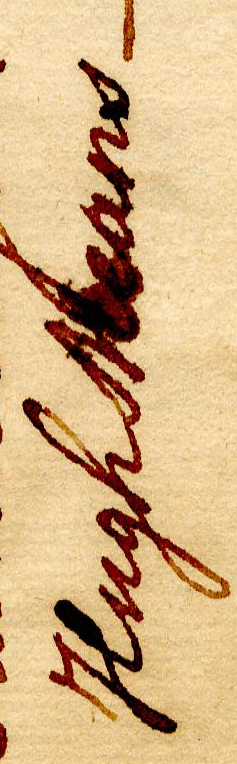Hugh Means
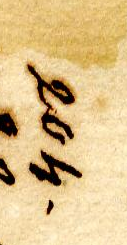204.
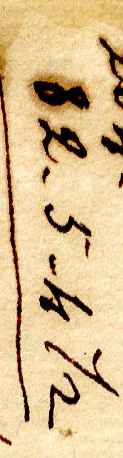82.5.472
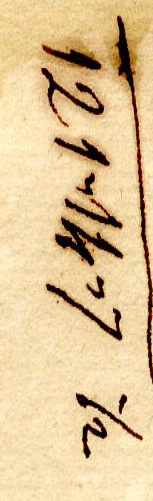121-14-7 1/2
